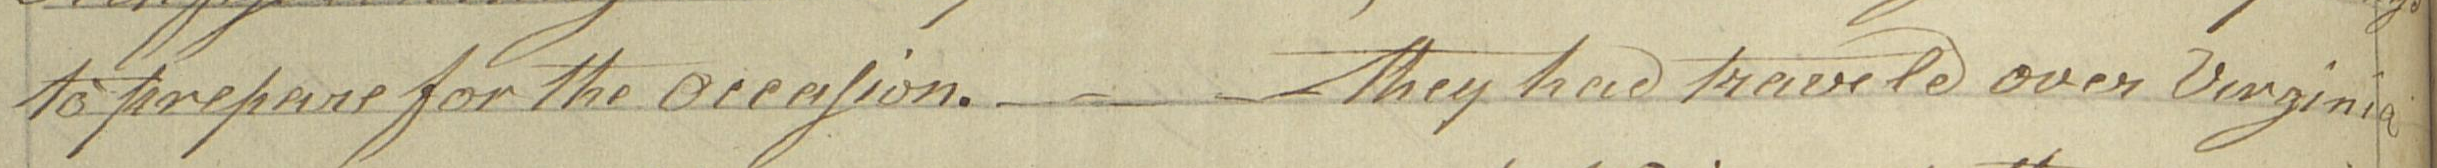to prepare for the occasion. They had traveld over Virginia
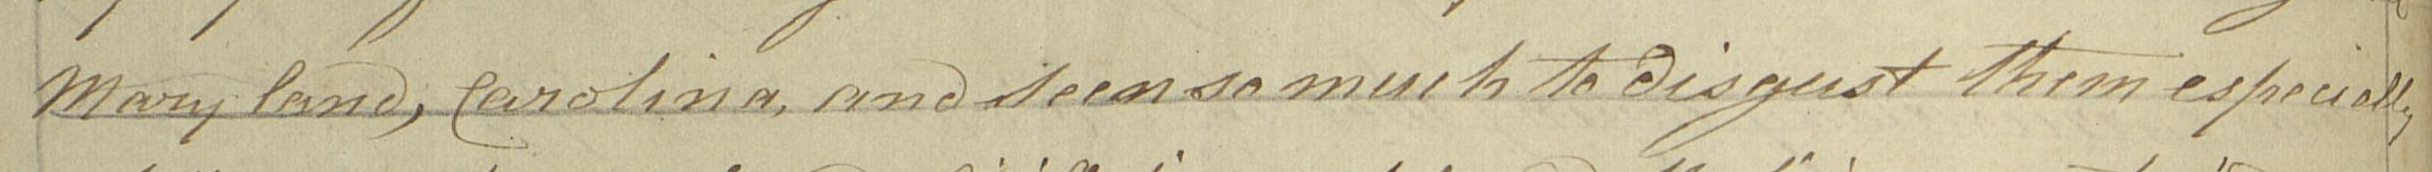Mary land, Carolina, and seen so much to disgust them especially
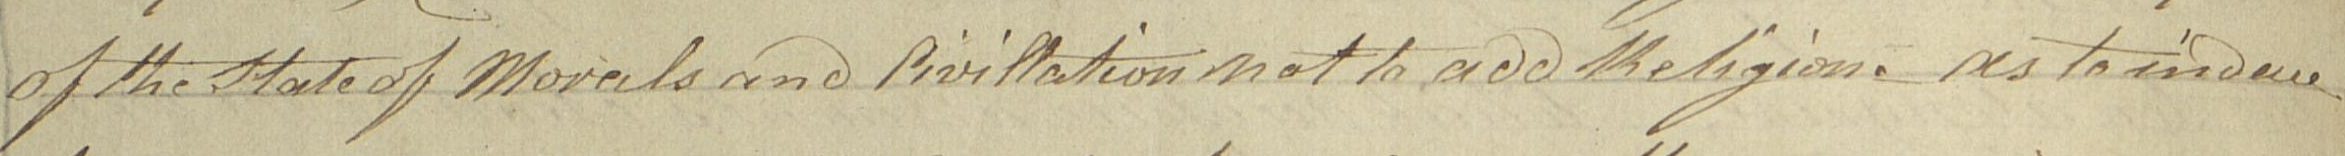of the state of Morals and Civillation not to add Religion, as to induce
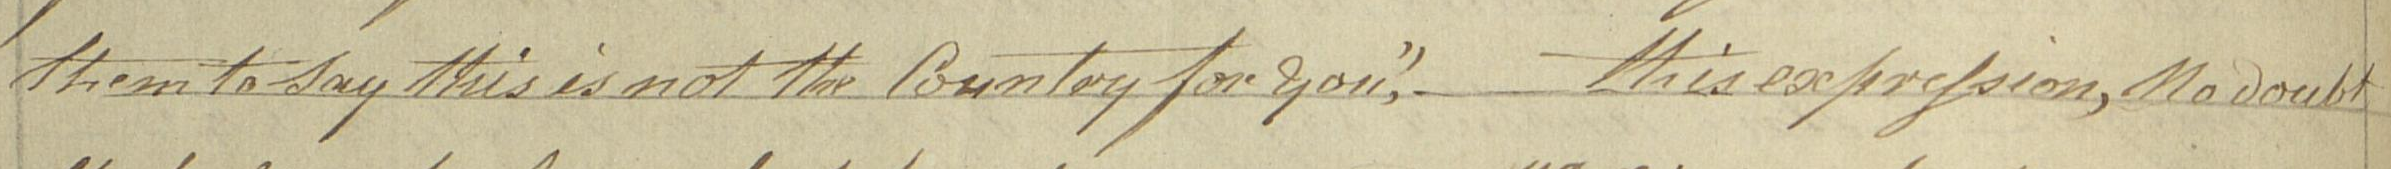them to say this is not the Country for you." This expression, No doubt
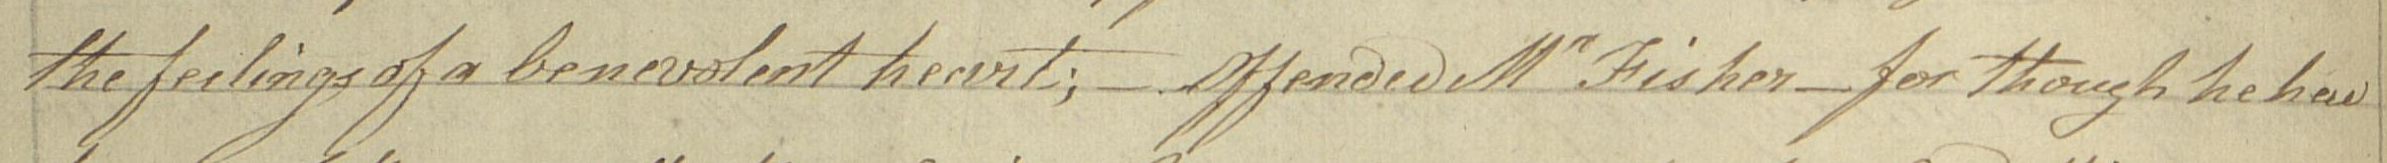the feelings of a benevolent heart, Offended M^r Fisher for though he had
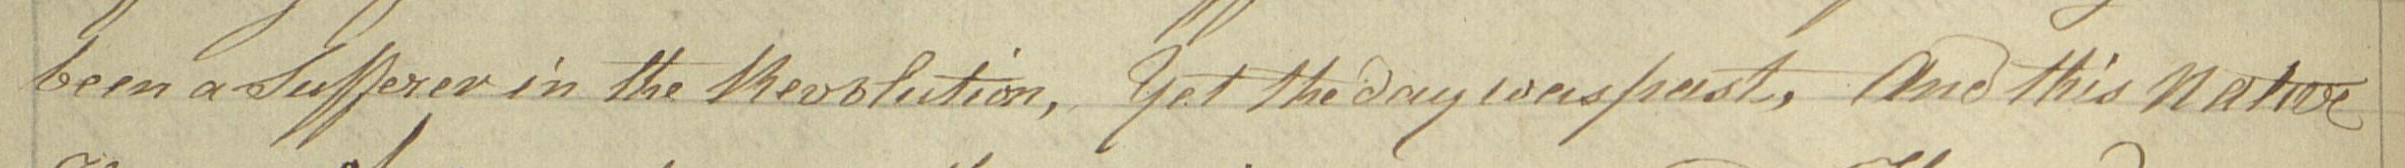been a Sufferer in the Revolution, Yet the dry was past and this Native
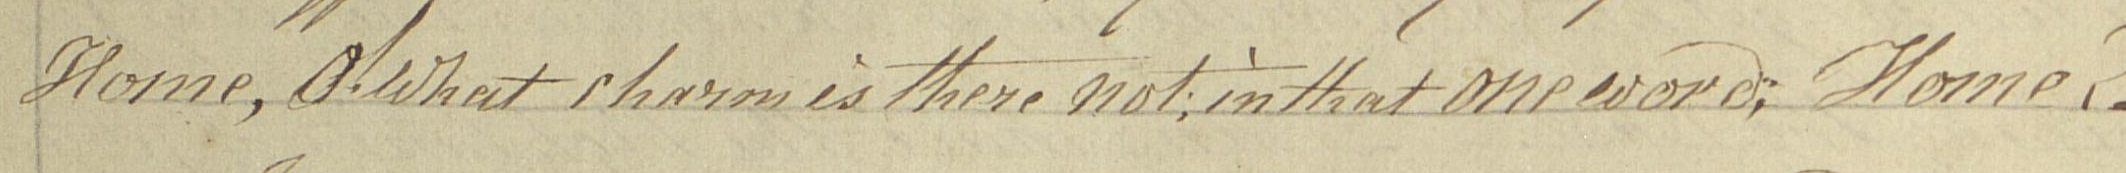Home, O! What charm is there not in that one word; Home?
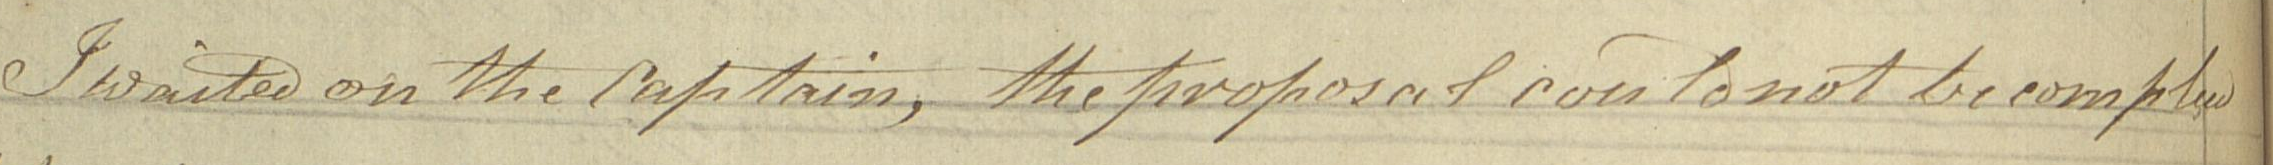I waited on the Captain, the proposal could not be compl-
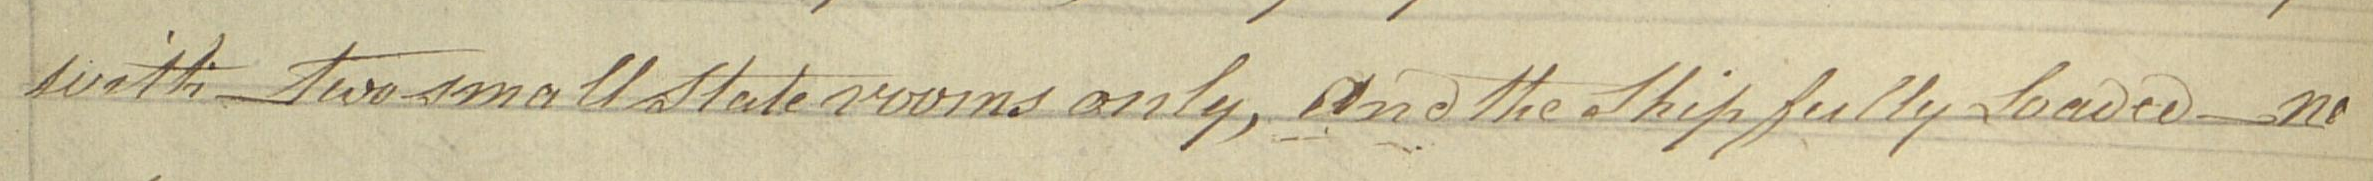with two small State rooms only, and the Ship fully Loaded no
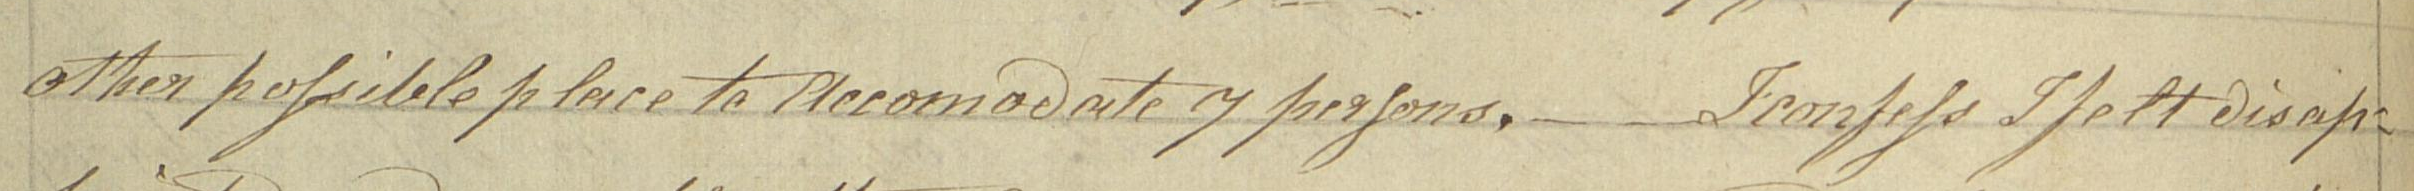other possible place to Accomodate 7 persons. I confess I felt disap-
